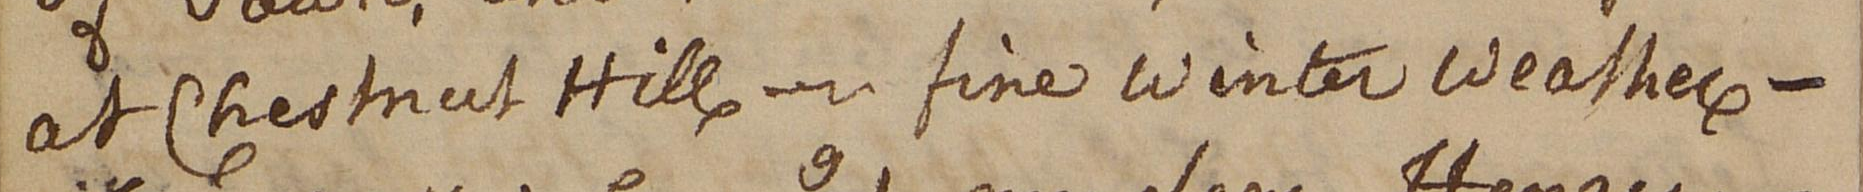at Chestnut Hill- fine winter Weather-
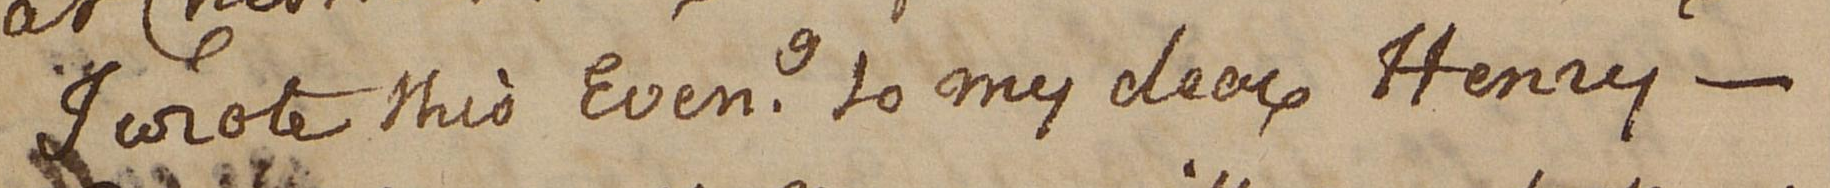I worte this Even^g. to my dear Henry-
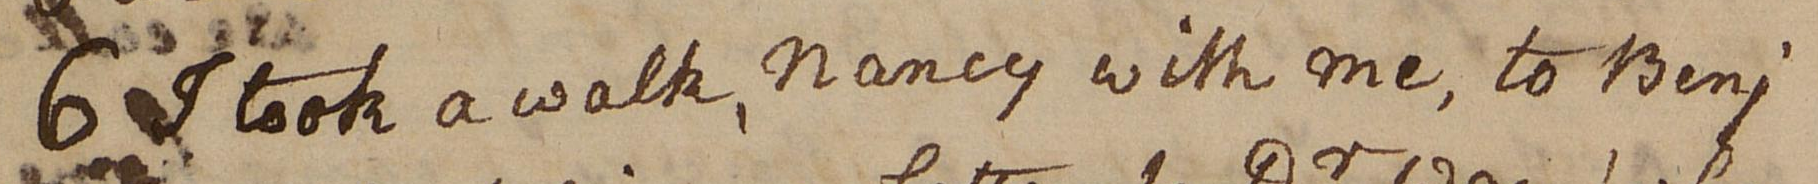6 I took a walk, Nancy with me, to Benj
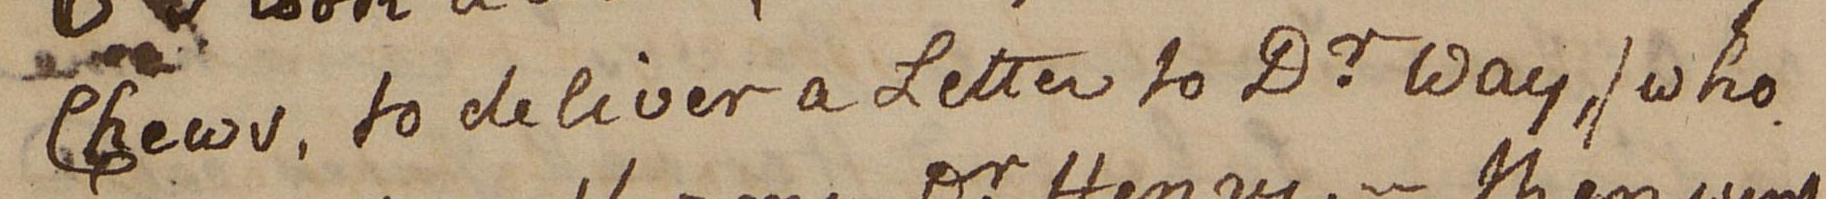Chews, to deliver a Letter to D^r. Way, /who
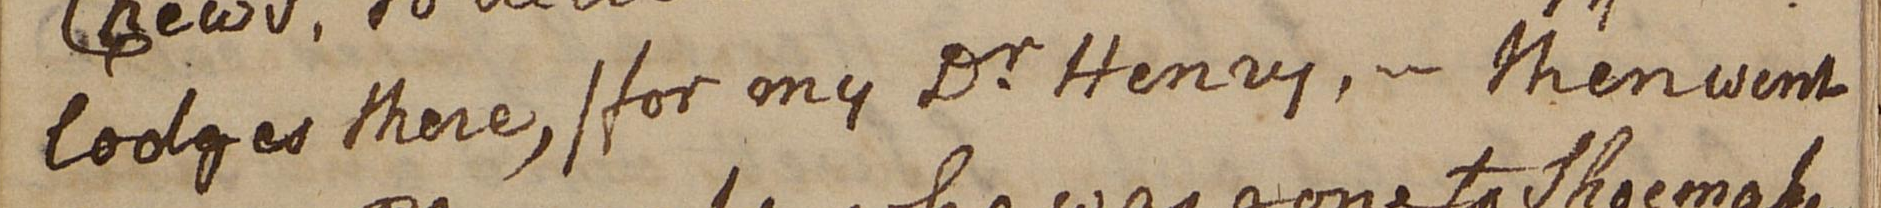lodges there, /for my D^r. Henry,- then went
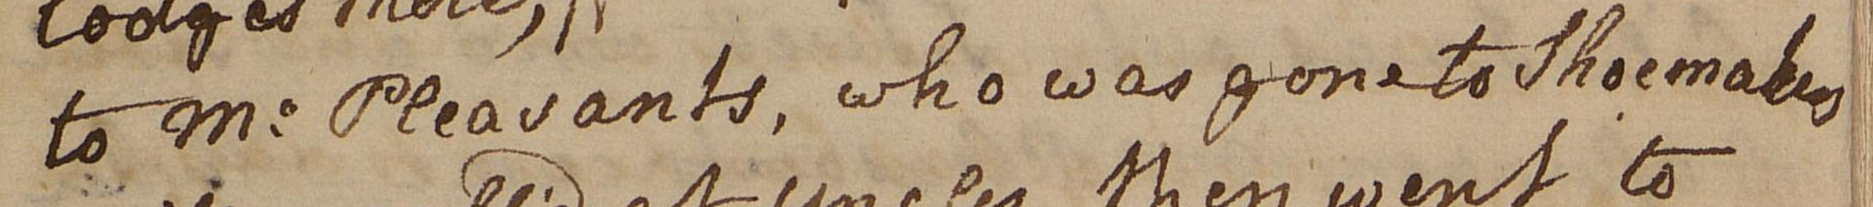to M^o. Pleasants, who was gone to Shoemakers
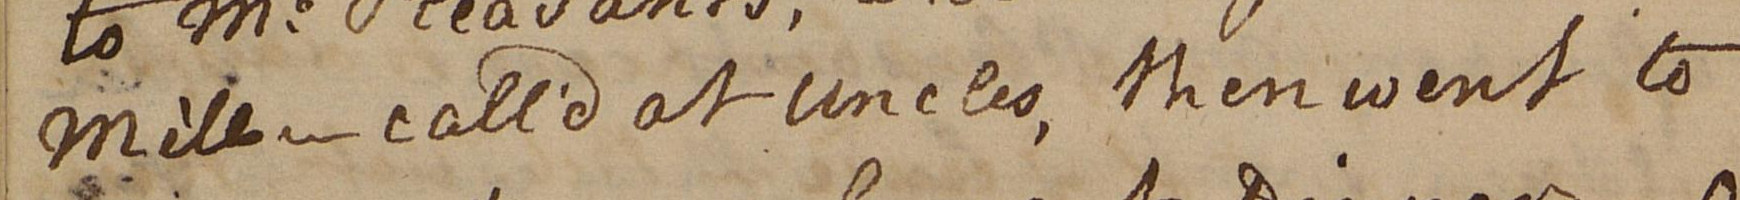Mile- call'd at Uncles, then went to
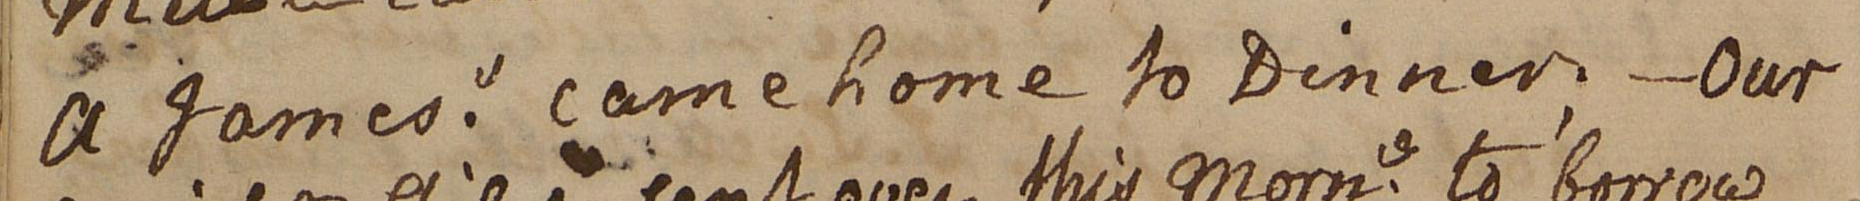A James^s. came home to Dinner;- Our
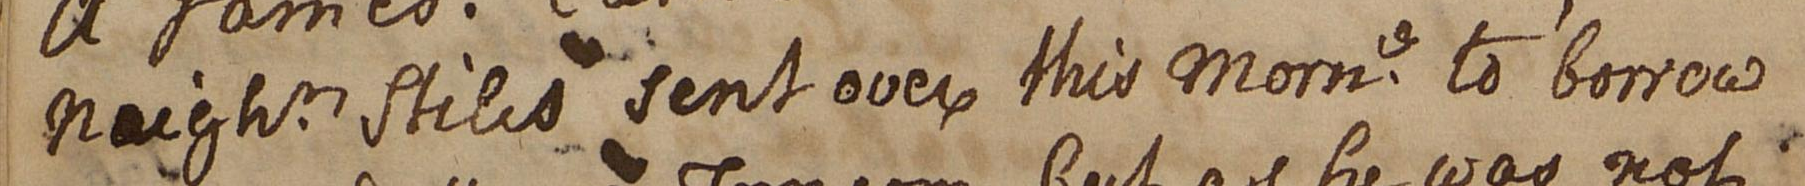Neigh^r. Stiles sent ever this Morn^g. to borrow
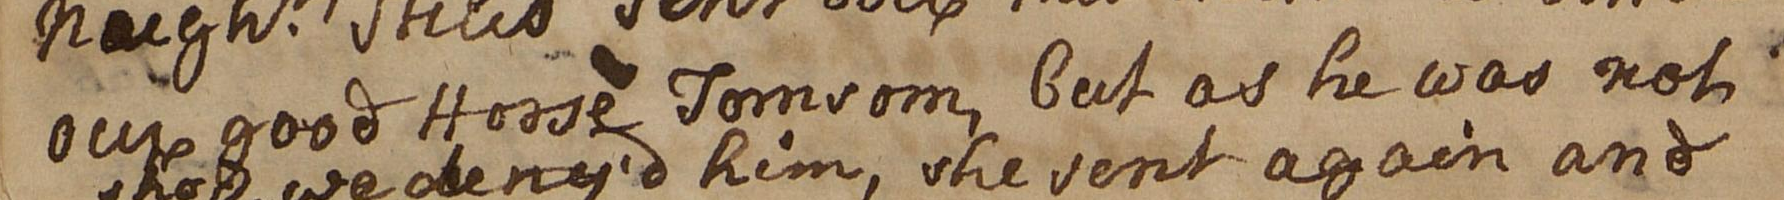our good Horse Tomsom, but as he was not
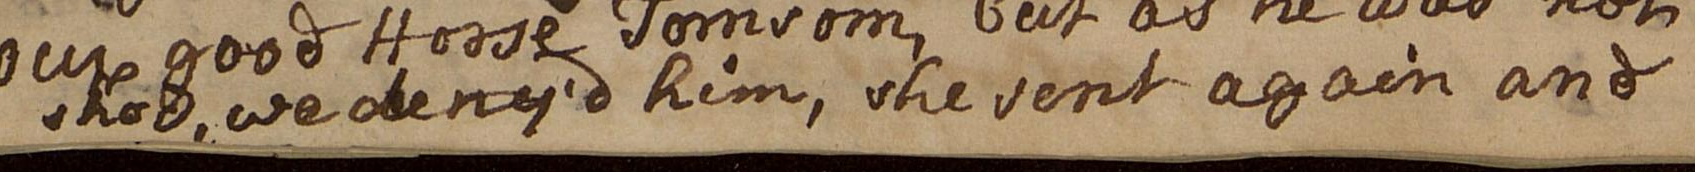shed we deny'd him, she sent again and
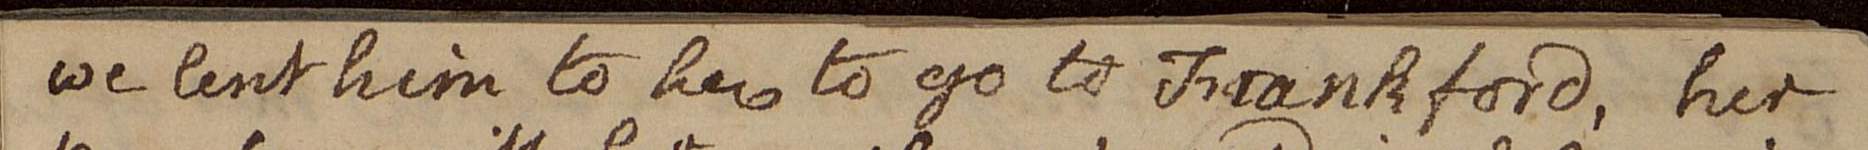we lent him to bey to go to Frankford, her
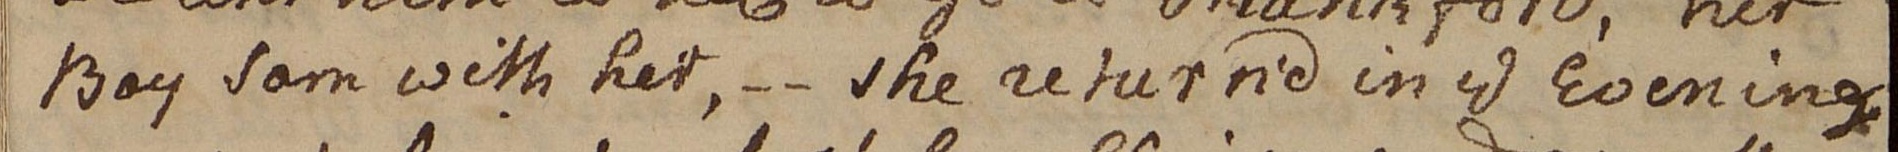Boy Sam with her,-- she return'd in y^e Evening
